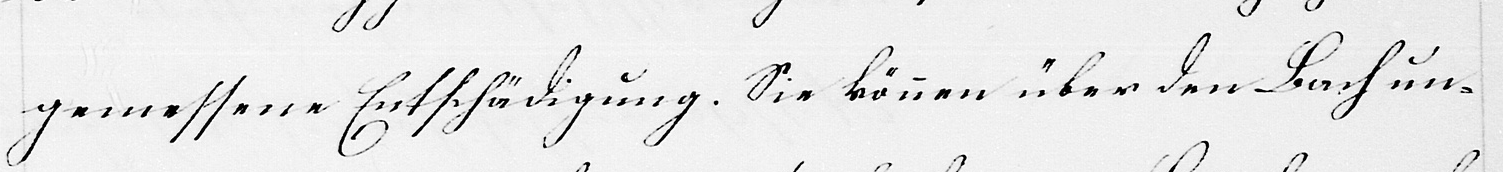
gemessene Entschädigung. Sie können über den Bach un¬
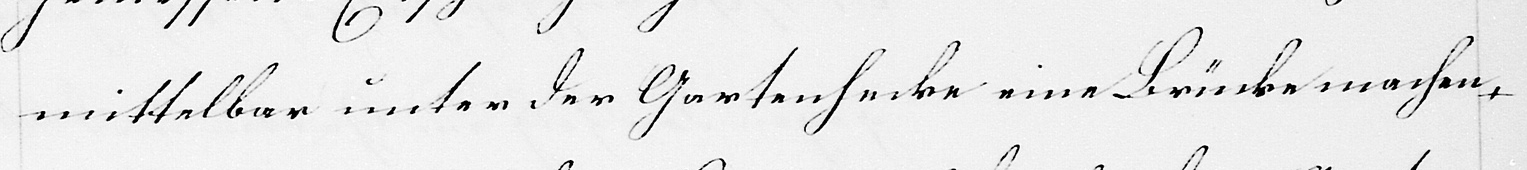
mittelbar unter der Gartenhecke eine Brücke machen
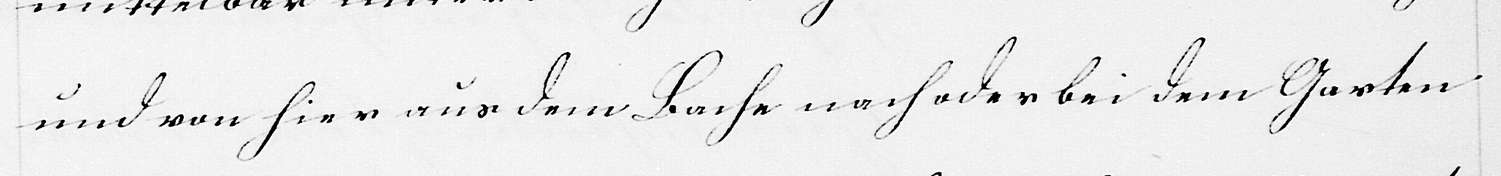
und von hier aus dem Bache nach oder bei dem Garten
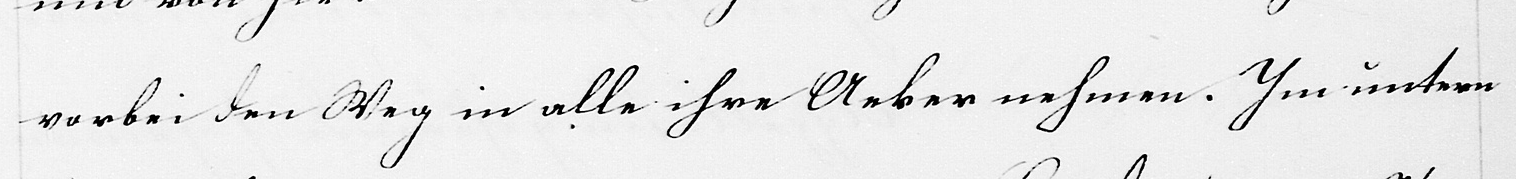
vorbei den Weg in alle ihre Aeker nehmen. Im untern
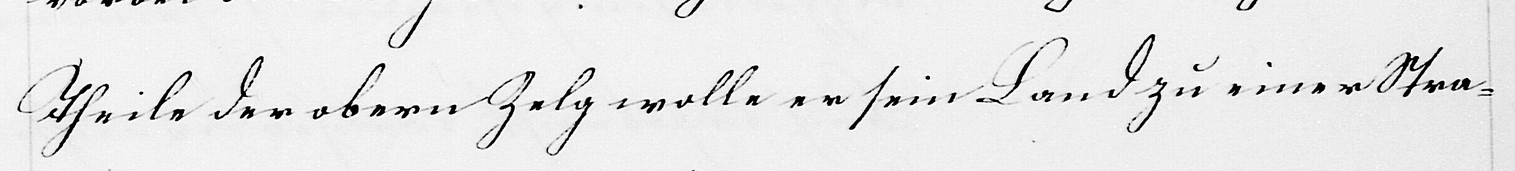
Theile der obern Zelg wolle er sein Land zu einer Stra¬
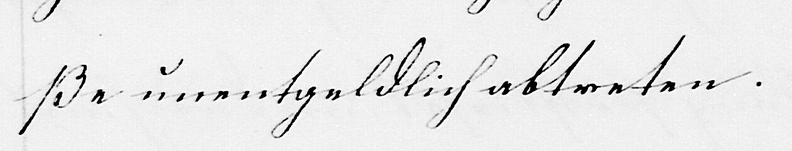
ße unentgeldlich abtreten.
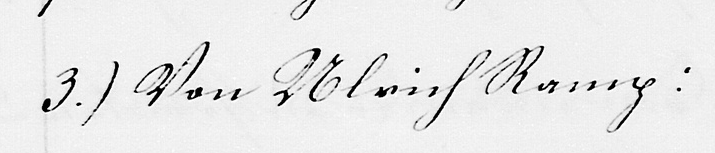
3.) Von Ulrich Ramp:
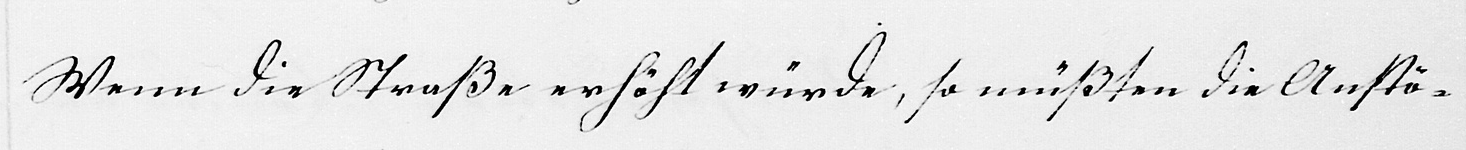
Wenn die Straße erhöht würde, so müßten die Anstö¬
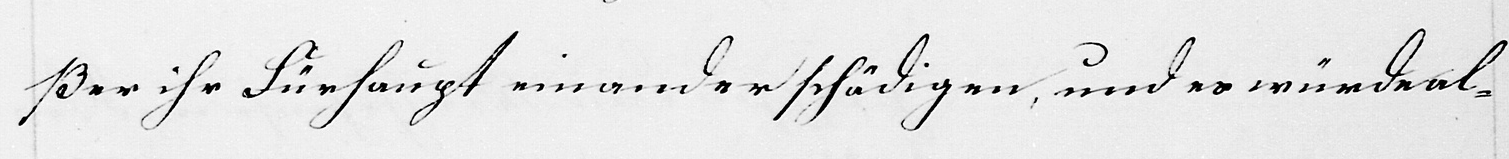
ßer ihr Fürhaupt einander schädigen, und es würde al¬
